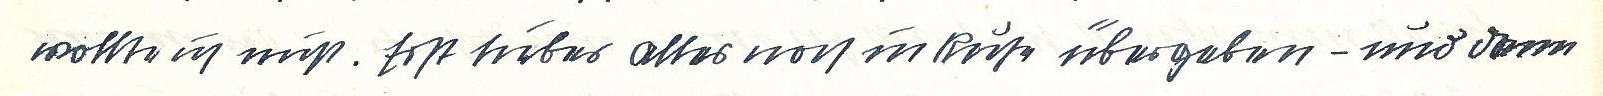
wollte ich nicht. Erst alles noch in Ruhe übergeben – und dann
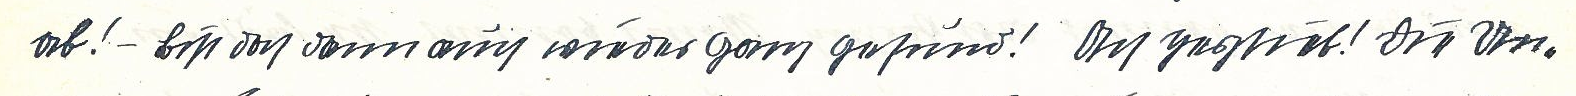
ab! – Bist doch auch wieder ganz gesund! Ach Herzlieb! Die Un¬
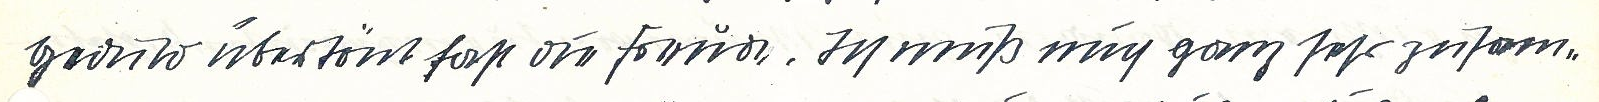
geduld übertönt fast die Freude. Ich muß mich ganz sehr zusam¬
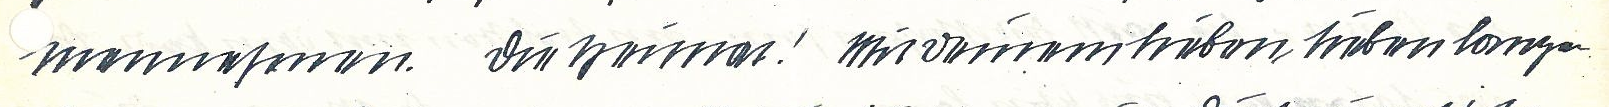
men nehmen. Die Heimat! Mit Deinem lieben, lieben langen
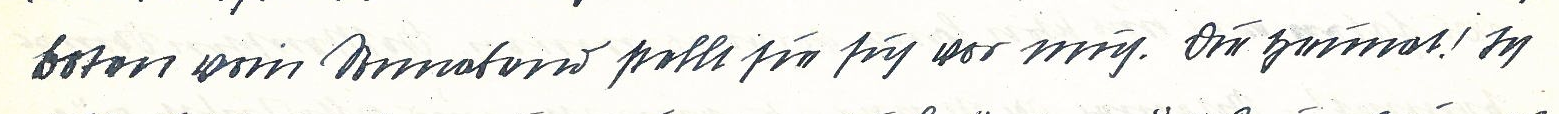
Boten vom Sonnabend stellt sie sich vor mich. Die Heimat!
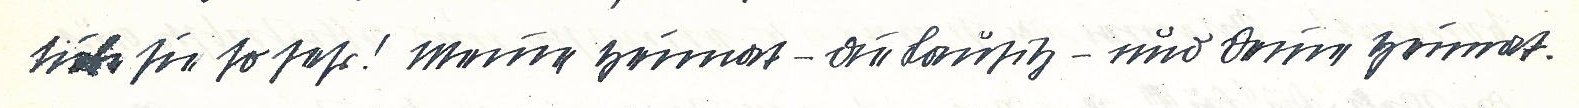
Ich liebe sie so sehr! Meine Heimat – die L. – und Deine Heimat.
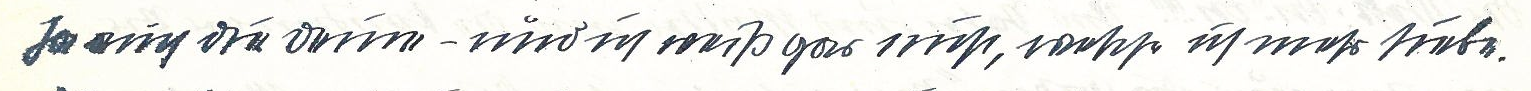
Ja auch die Deine – und ich weiß gar nicht – welche ich mehr liebe.
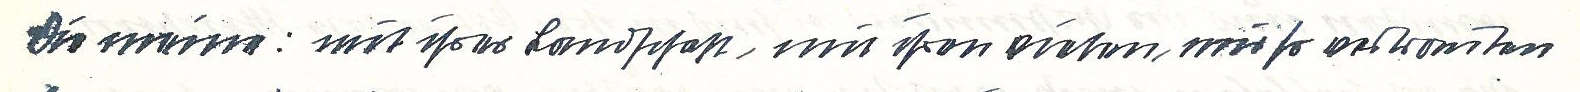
Die meine: mit ihrer Landschaft, mit ihren lieben, mir so vertrauten
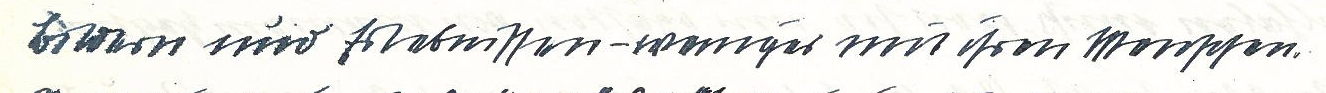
Bildern und Erlebnissen – weniger mit ihren Menschen.
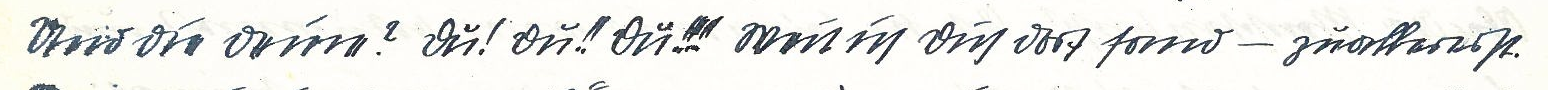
Und die Deine? Du! Du!! Du!!!!! Weil ich Dich dort fand – zu allererst.
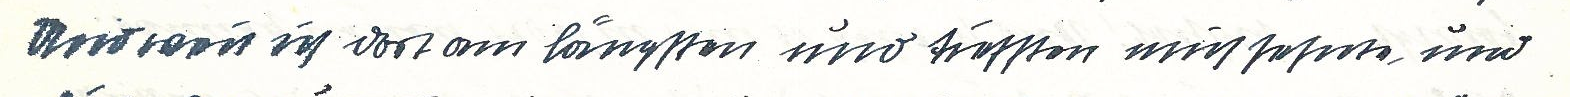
Und weil ich dort am längsten und tiefsten mich sehnte, und
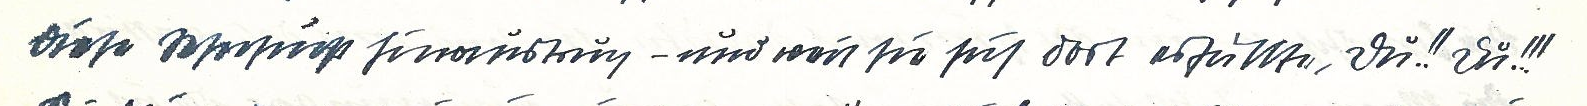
diese Sehnsucht hinaustrug – und weil sie sich dort erfüllte, Du!! Du!!!
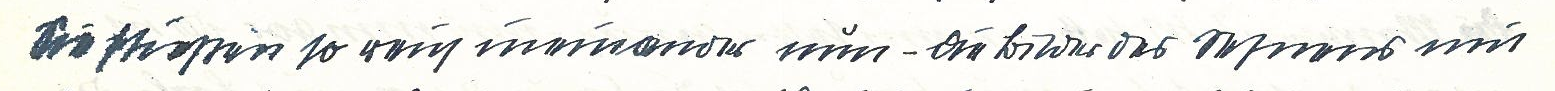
Sie fließen so weich ineinander nun – die Bilder des Sehnens mit
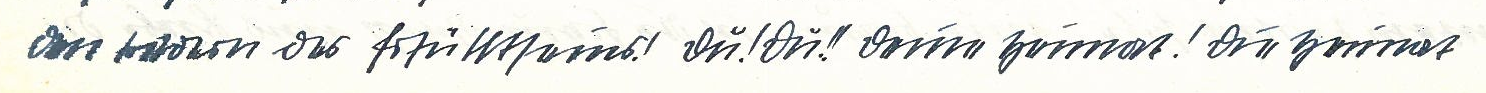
den Bildern des Erfülltseins! Du! Du!! Deine Heimat! Die Heimat
